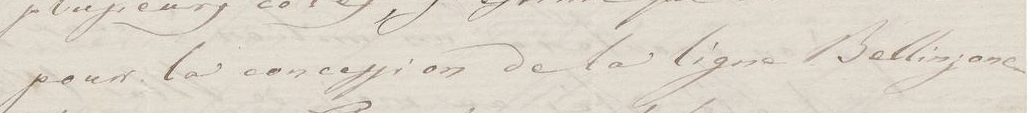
pour la concession de la ligne Bellinzone–
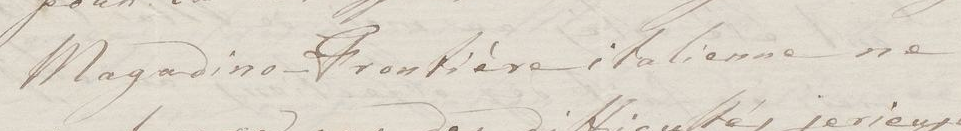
Magadino–Frontière italienne ne
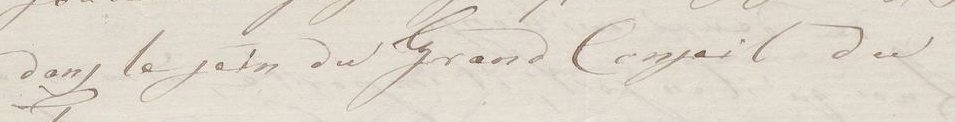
dans le sein du Grand Conseil du
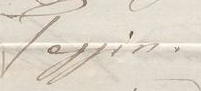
Tessin.
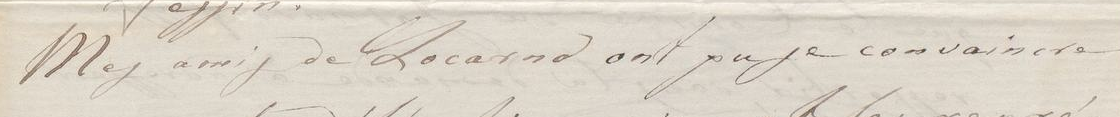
Mes amis de Locarno ont pu se convaincre
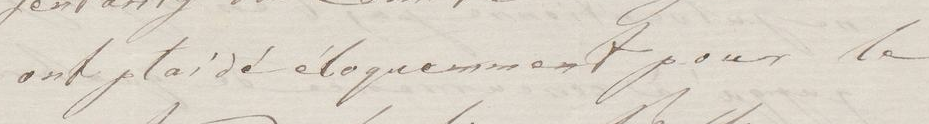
ont plaidé éloquemment pour le
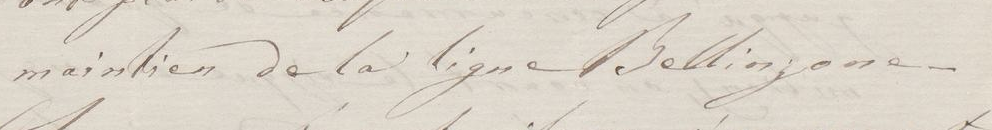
maintien de la ligne Bellinzone–
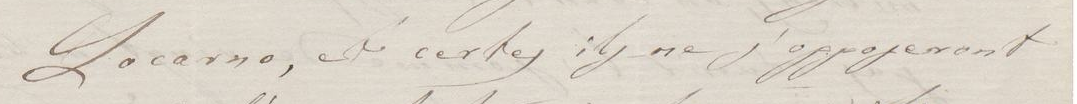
Locarno, et certes ils ne s'opposeront
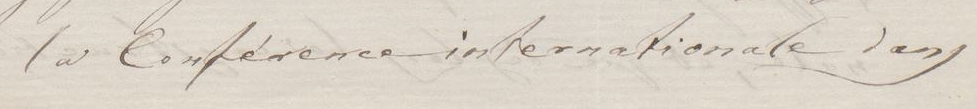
la Conférence internationale dans
